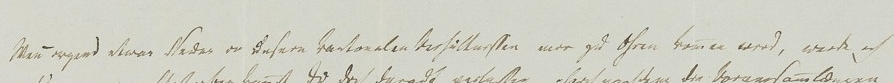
Wenn irgend etwas Neues in unsern kantonalen Verhälntissen mir zu Ohren kommen wird, werde ich
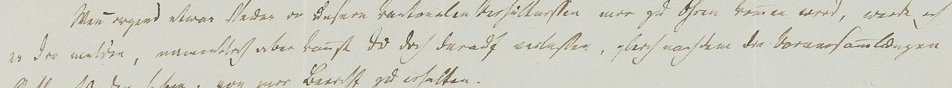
es Dir melden, namentlich aber kannst Du Dich darauf verlassen, gleich nachdem die Vorversammlungen
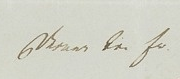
Deines tr. Fr.
